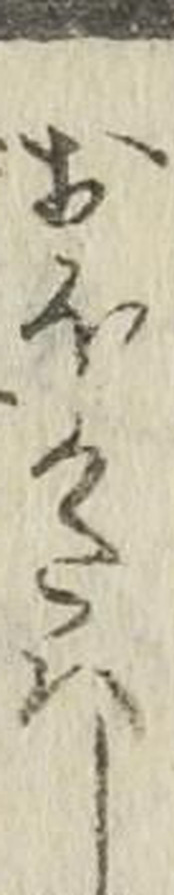おほかたは
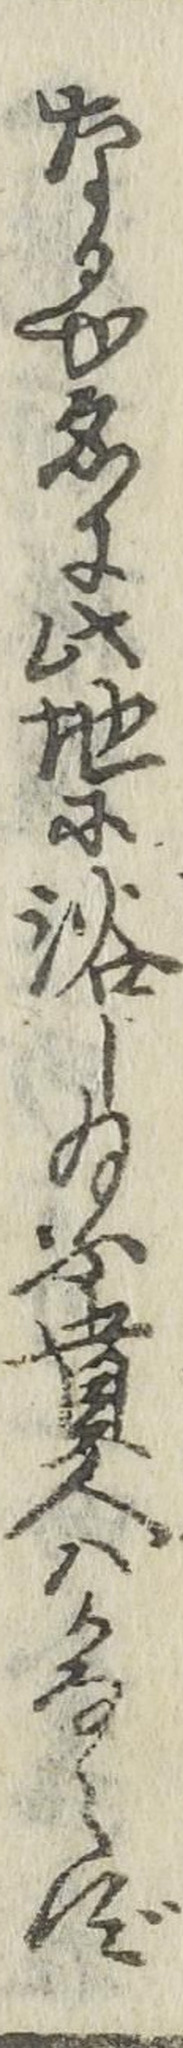なるゆゑに此地に浴し給ふ貴人はかならず
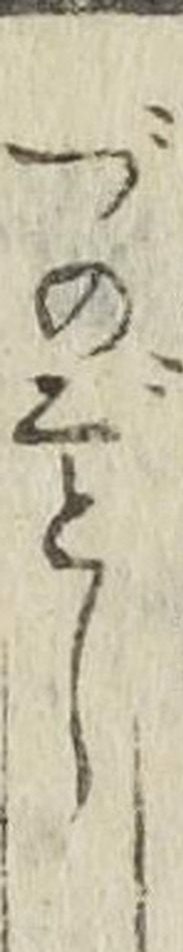づのごとし
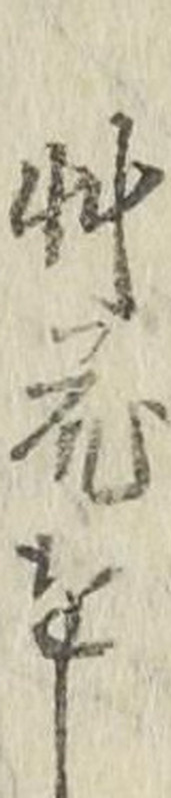艸花を
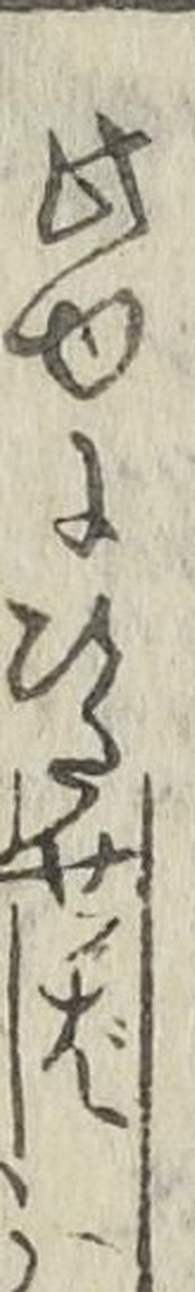此ゆにひたせば
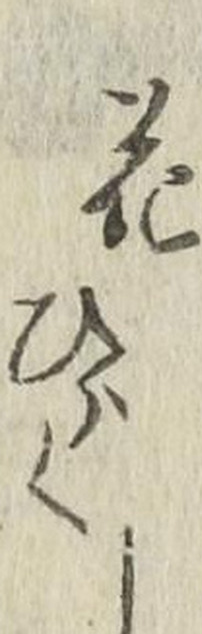ひらく
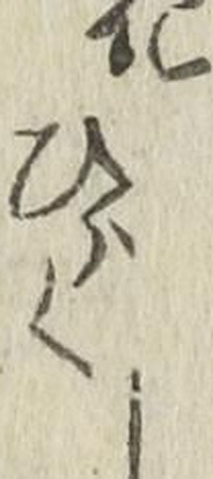ひらく
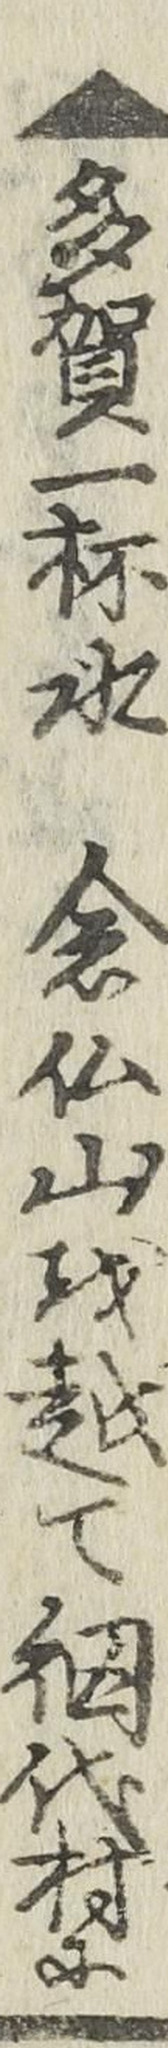▲多賀一杯水念仏山を越て網代村に
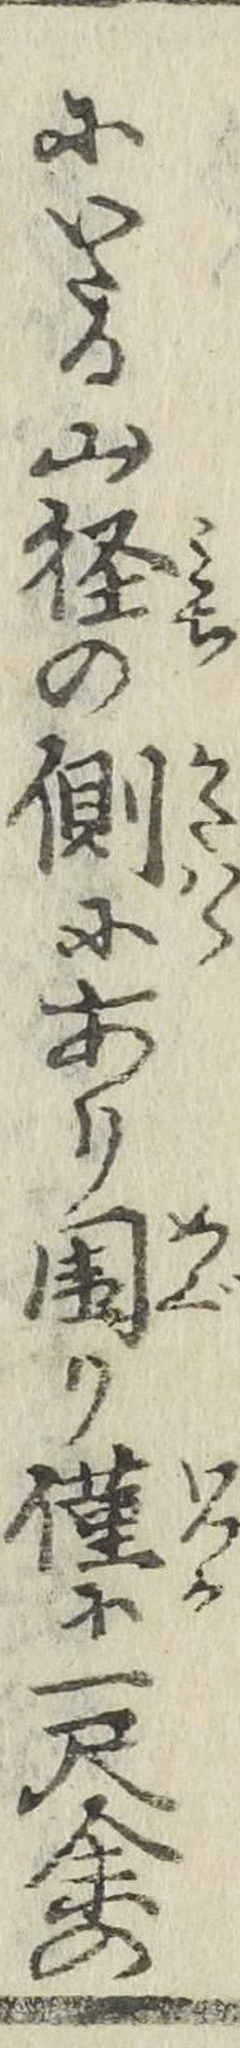にいたる山径の側にあり囲り僅に一尺余の
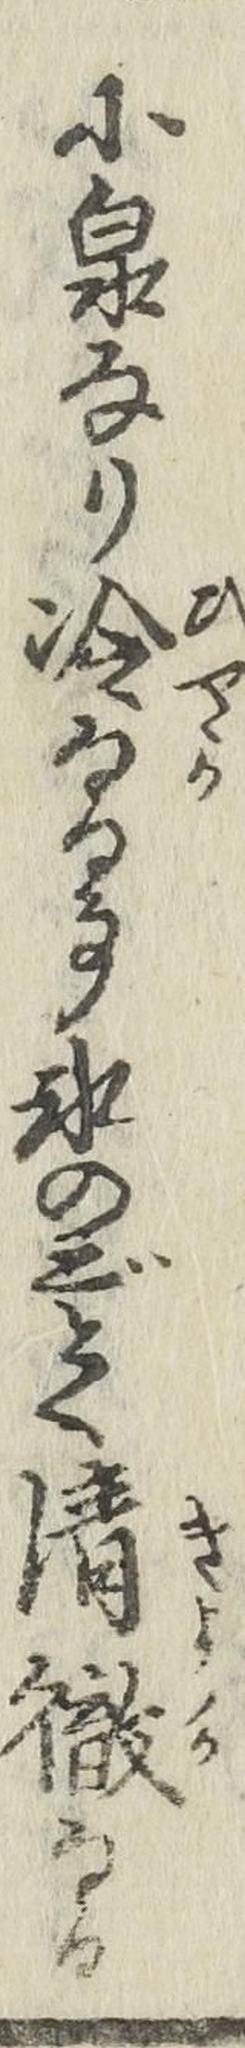小泉なり冷なる事氷のごとく清徹なる
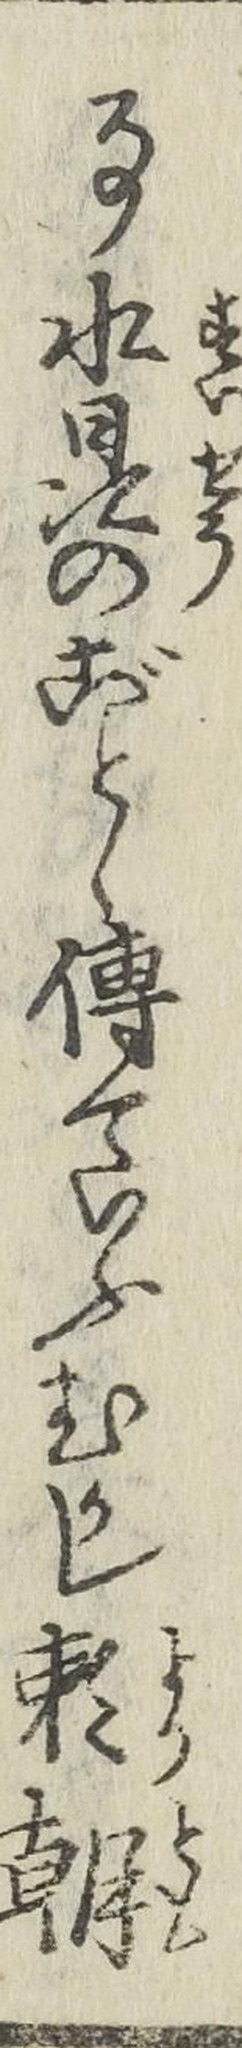事水晶のごとし伝ていふむかし頼朝

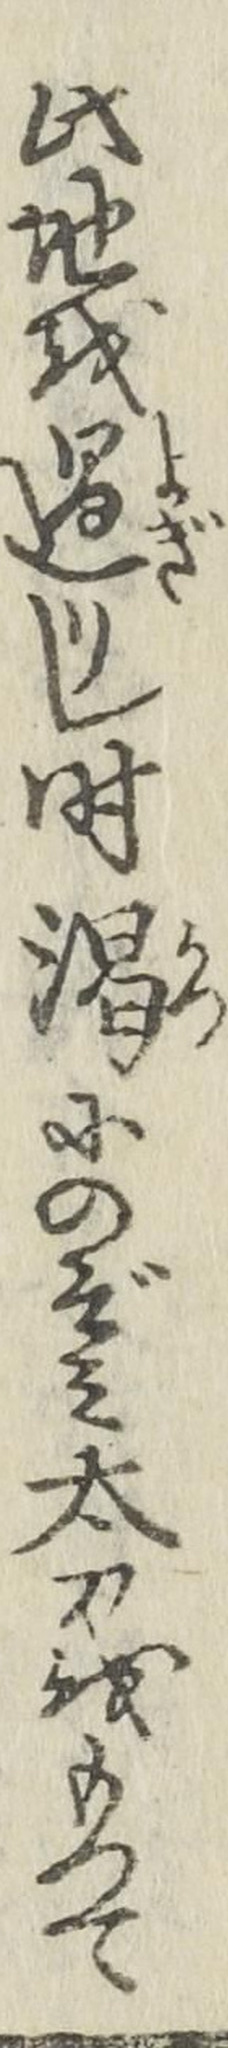此地を過りし時渇にのぞみ太刀をもつて
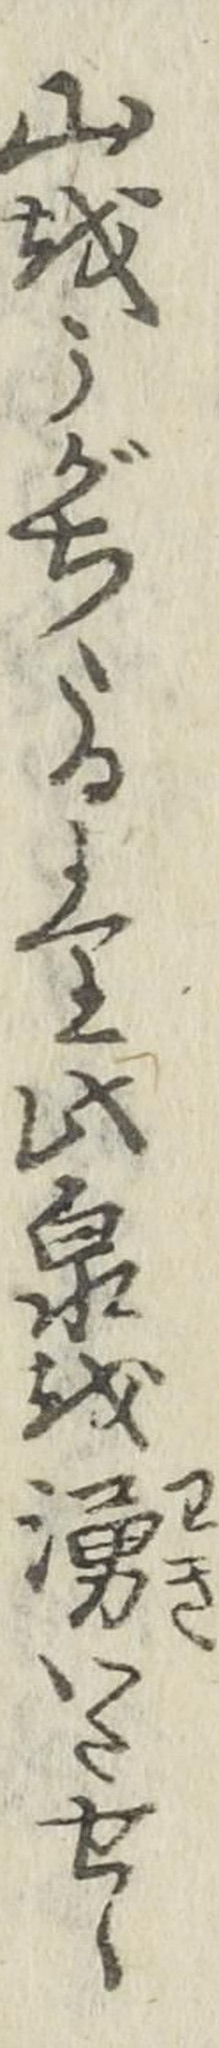山をうがちたるより此泉を湧いたせし
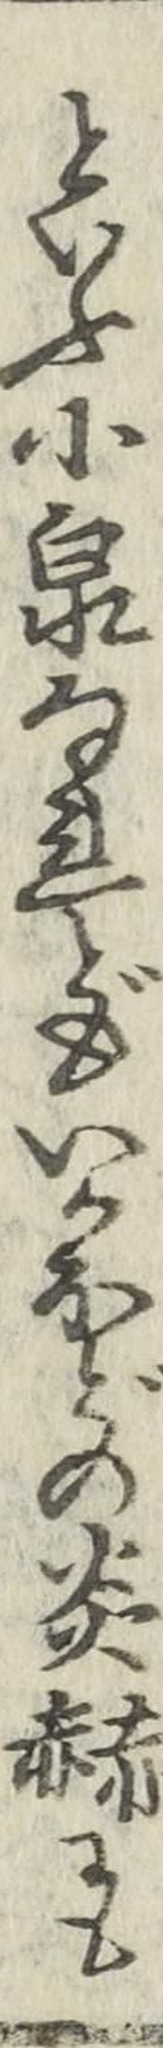といふ小泉なれどもいかほどの炎赫にも
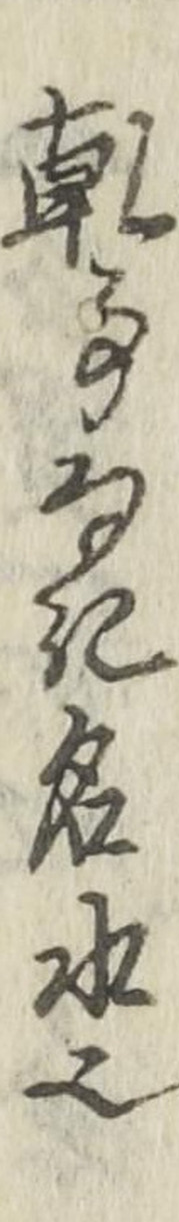乾事なき名水也
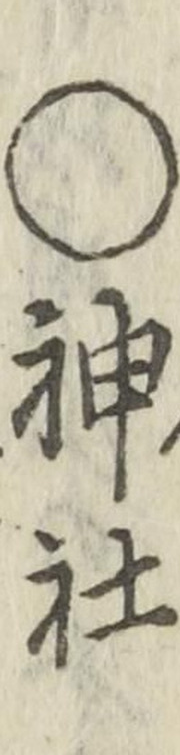○神社
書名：熱海温泉圖彙
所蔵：東京大学地震研究所図書室 Earthquake Research Institute Library, The University of Tokyo, JAPAN
